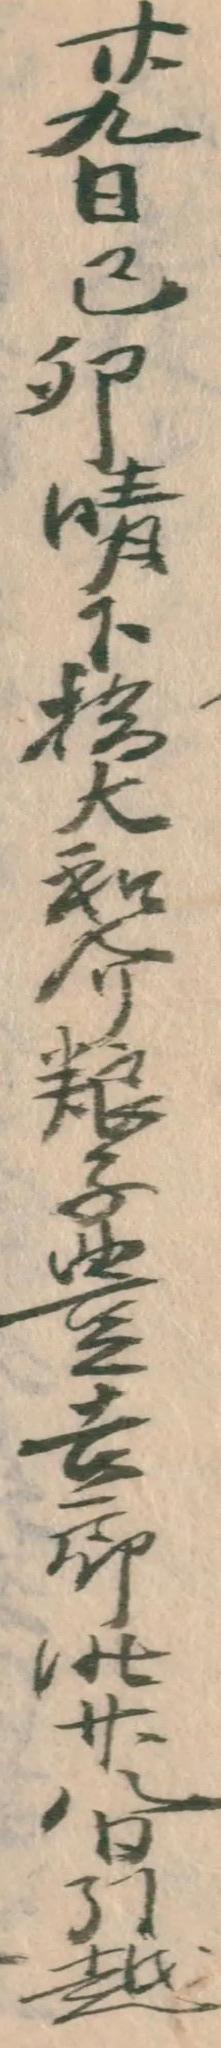廿九日己卯晴下橋大和介粮子豊吉郎昨廿八日引越
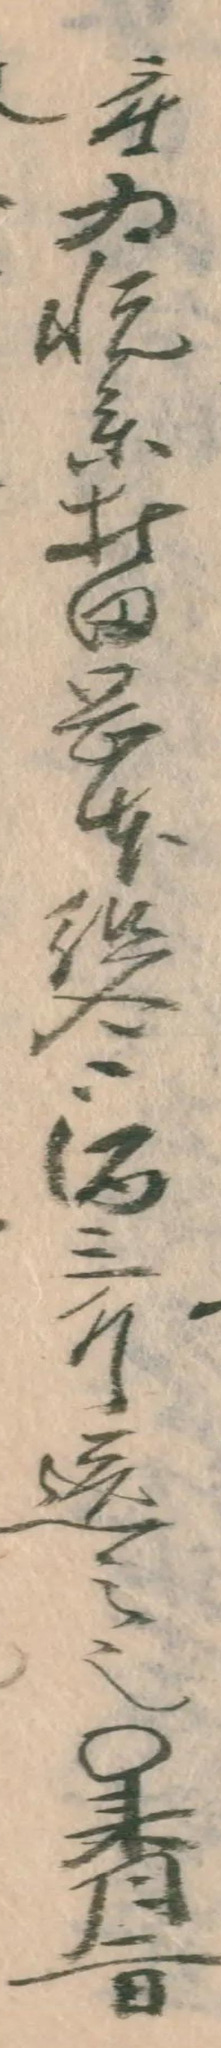ニ付為祝参村田岡本組合御酒三升送之也○来月二日
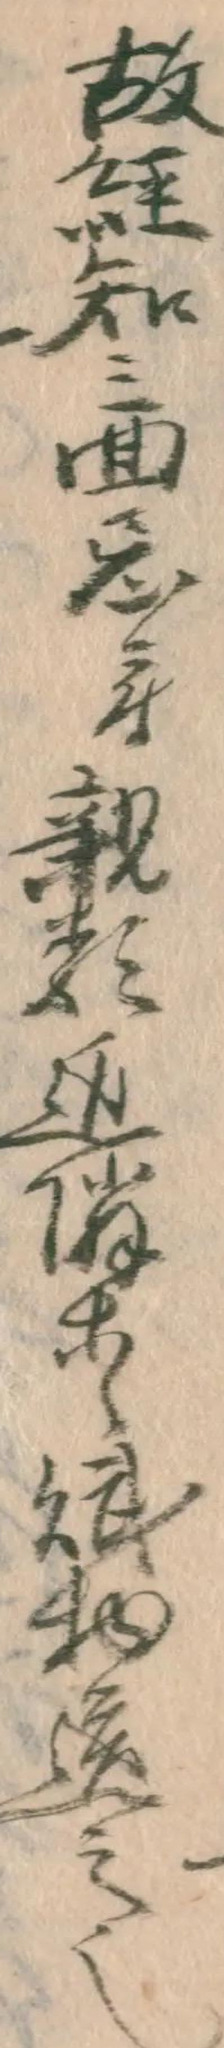故経知三回忌ニ付親類近隣等へ賦物造之也
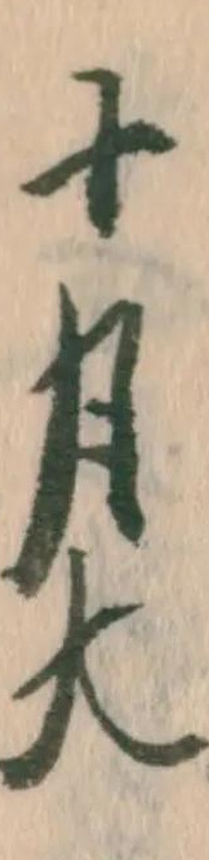十月大
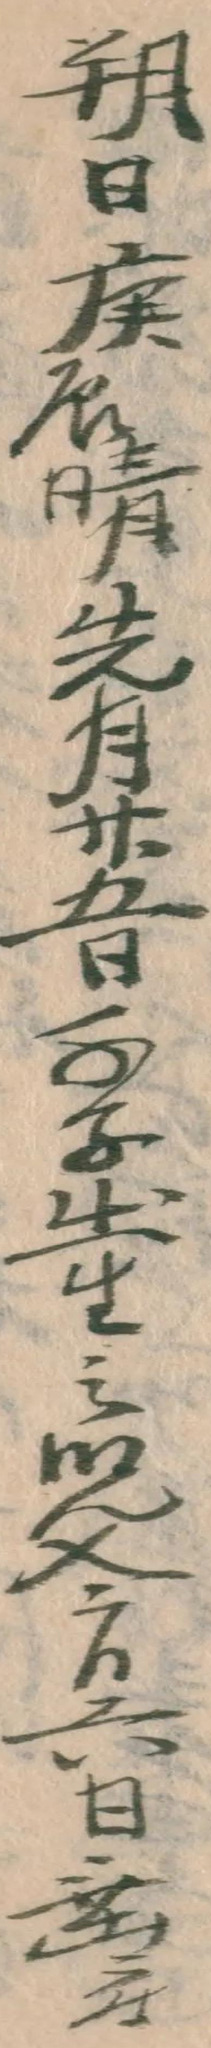朔日庚辰晴先月廿五日千子出生之晩今日六日垂ニ付
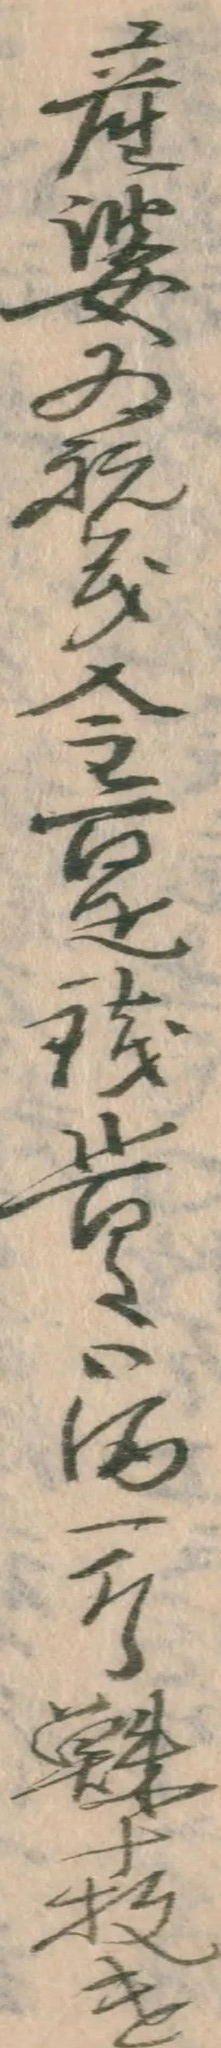産婆為祝義金百疋銭弐百文御酒一升鮭十枚遣
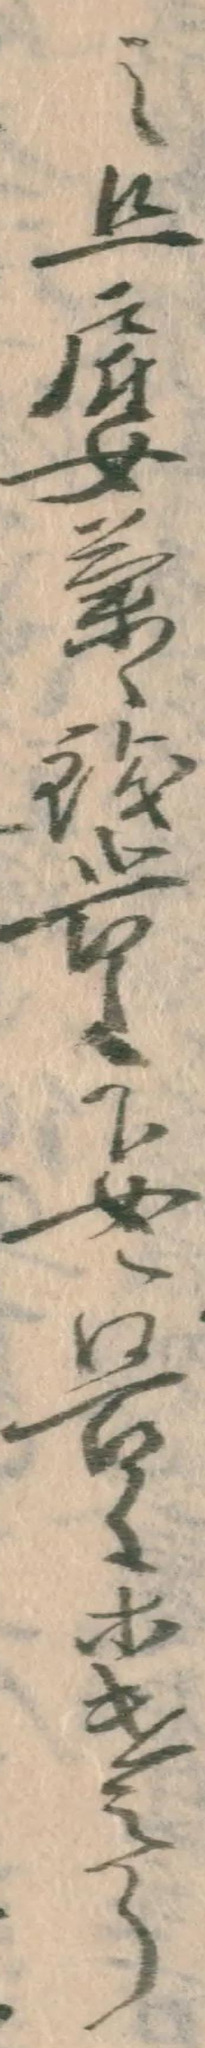之且雇女兼候銭弐百文下女へ同百文等遣之了
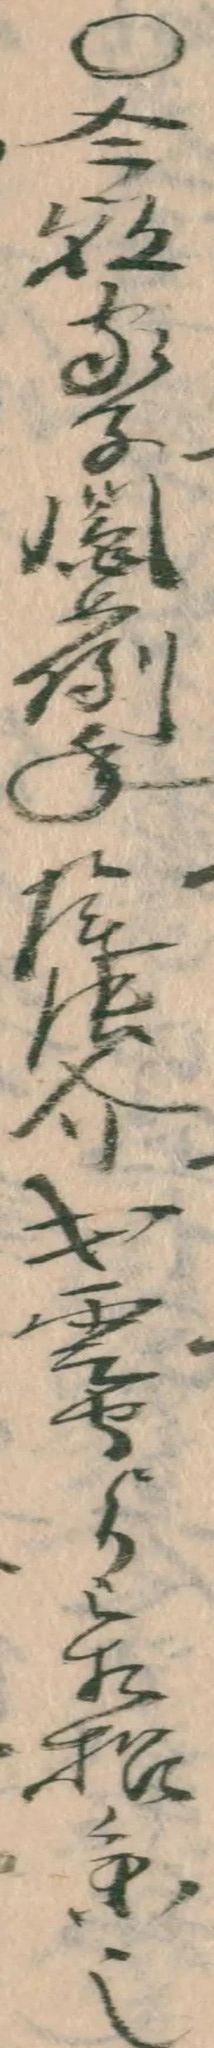○今朝家子鬮如例年尾張介出雲守より被相招参也
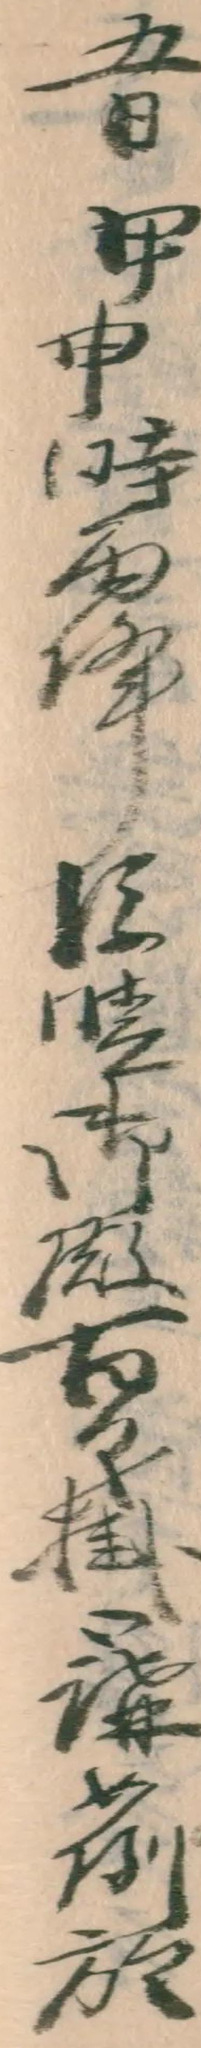五日甲申時雨降後晴御殿百文掛御講如例於
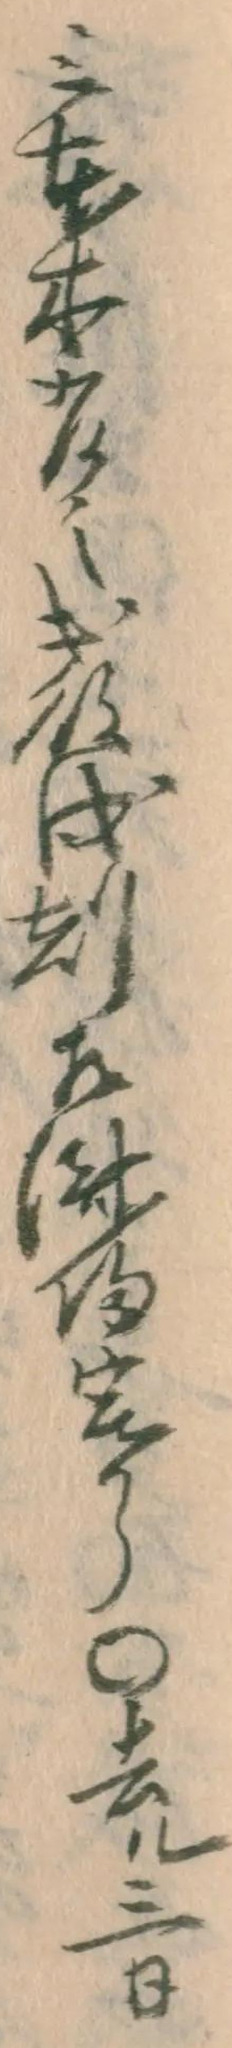三本本有之出役戌刻相済帰宅了○去ル三日
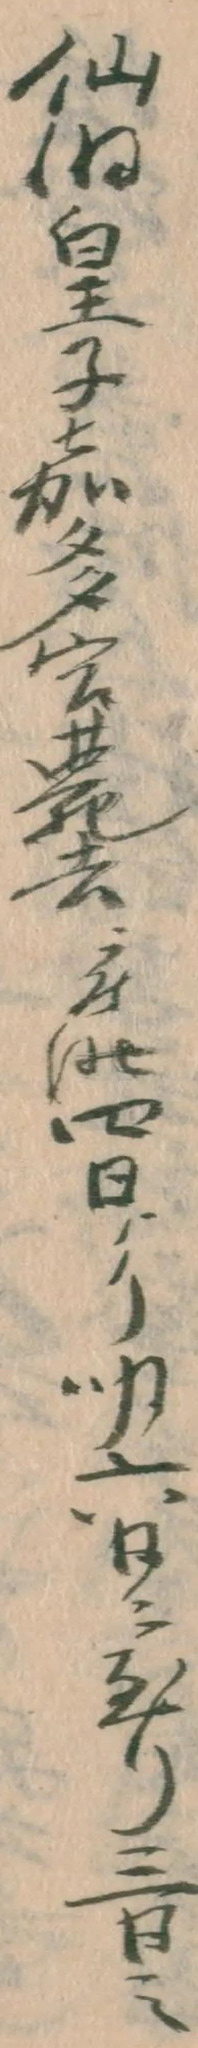仙洞皇子嘉多宮薨去ニ付昨四日より明六日ニ至リ三日之
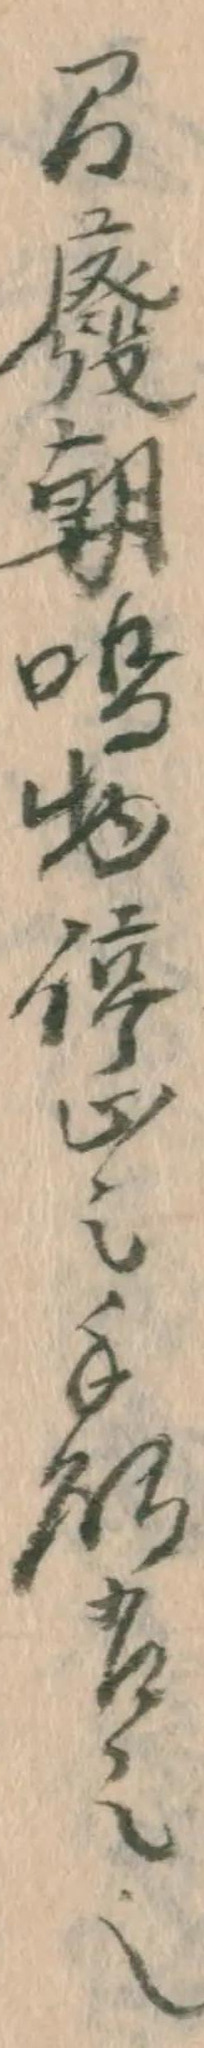間廃朝鳴物停止之手觸有之也
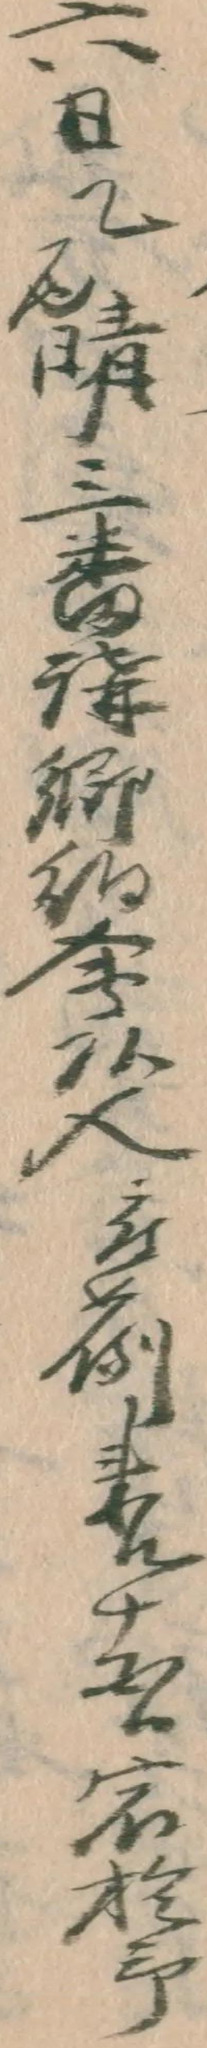六日乙酉晴三番講郷約會頭人ニ付如例来ル十五日宿於予
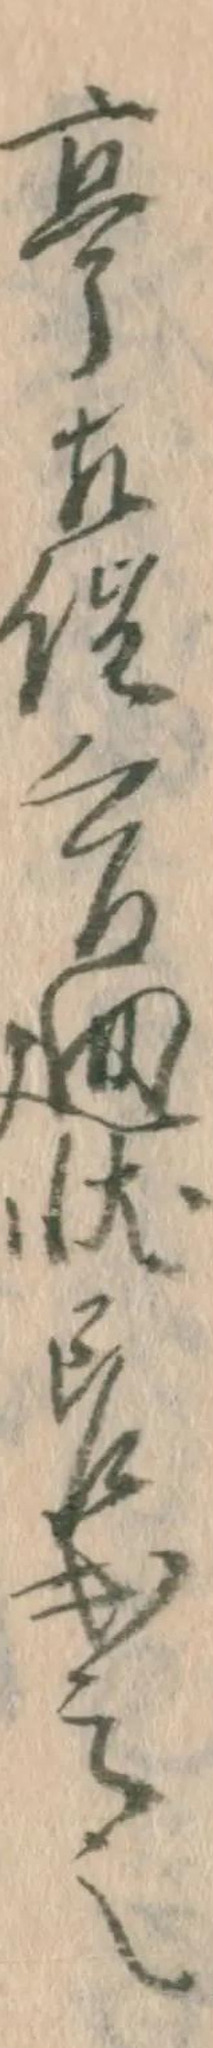亭相催六日廻状差出之也
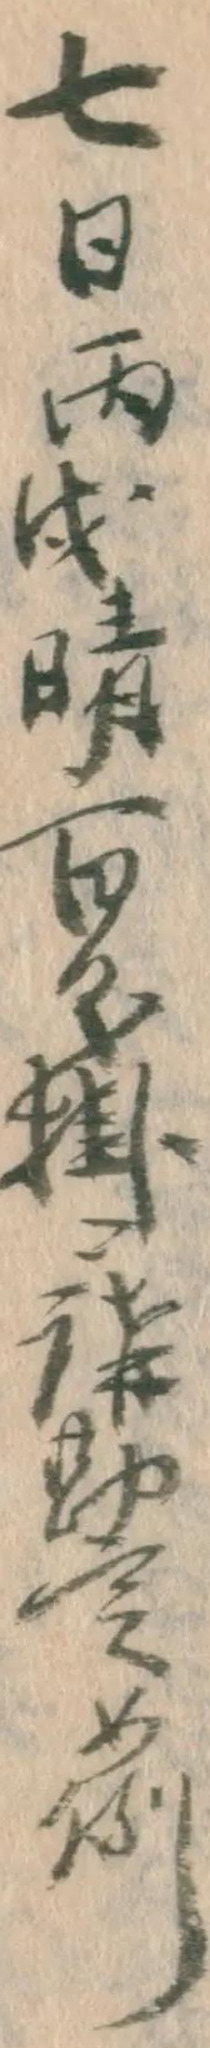七日丙戌晴百匁掛御講勘定如例
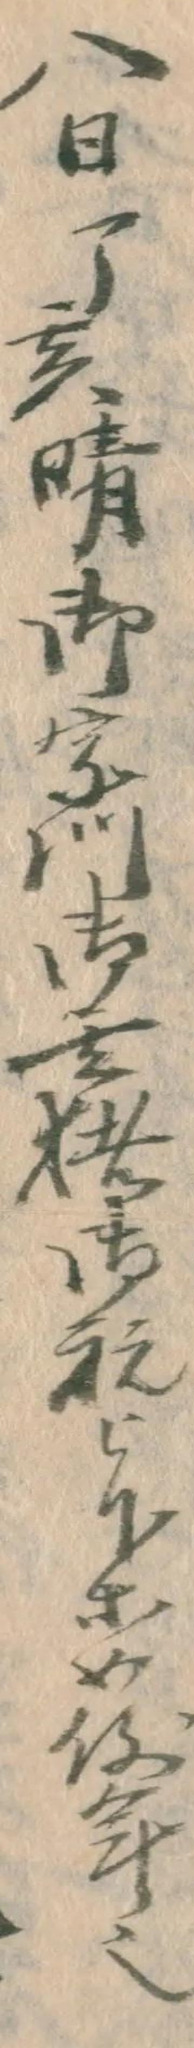八日丁亥晴御家門御玄猪御祝被下等如例年也
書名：賀茂社記録. 第67冊
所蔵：国立国会図書館 National Diet Library, JAPAN
